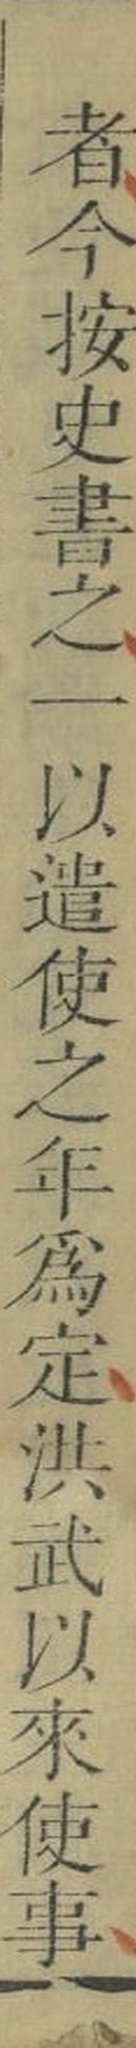者今按史書之一以遣使之年爲定洪武以來使事
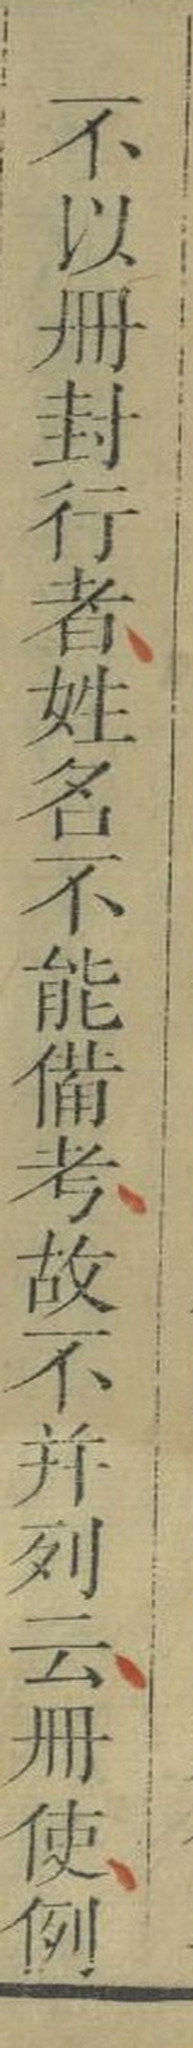不以冊封行者姓名不能備考故不幷列云冊使例
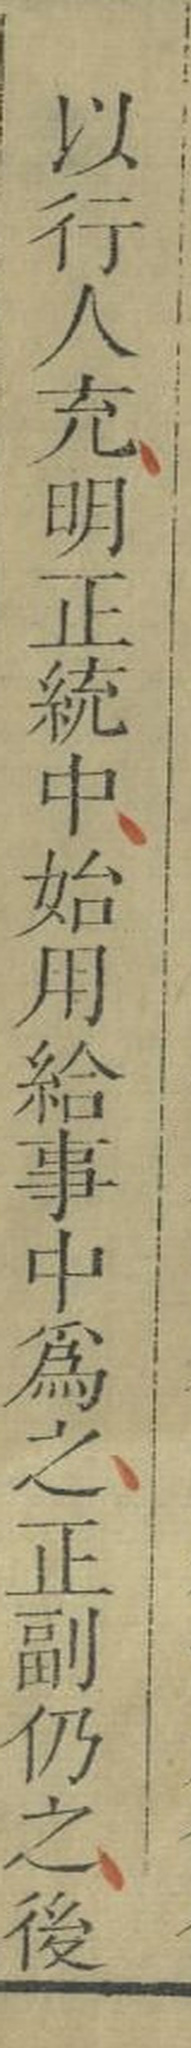以行人充明正統中始用給事中爲之正副仍之後
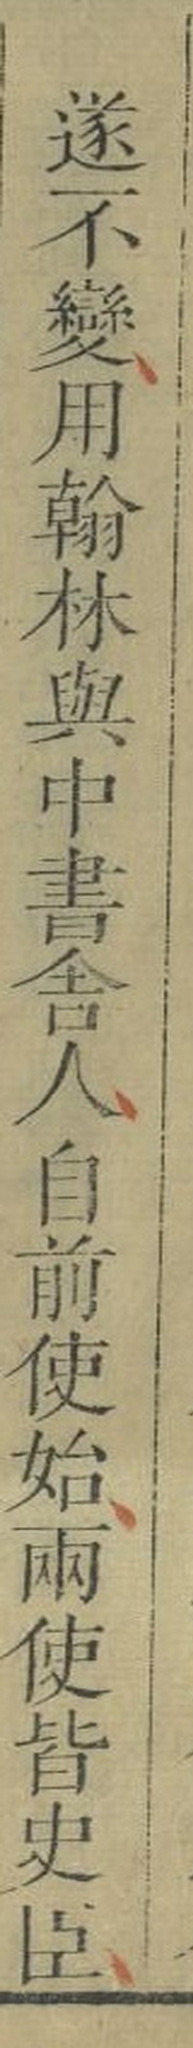遂不變用翰林與中書舎人自前使始兩使皆史臣
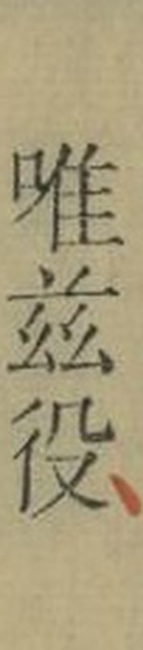唯茲役
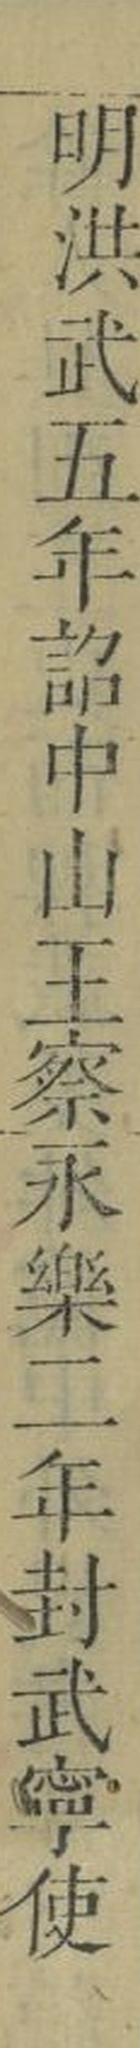明洪武五年詔中山王察永樂二年封武寧使
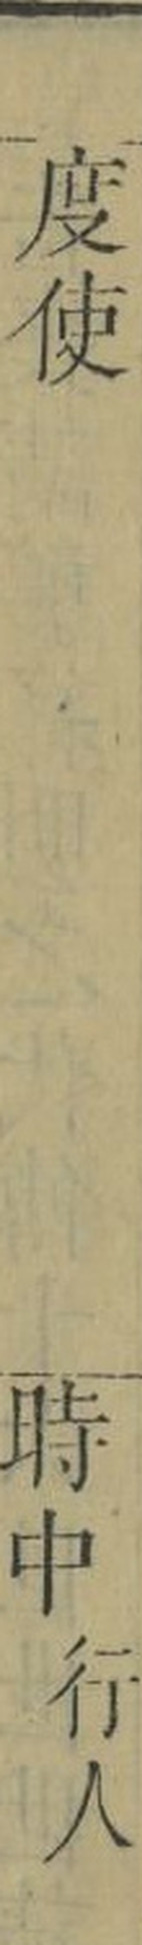度使時中行人
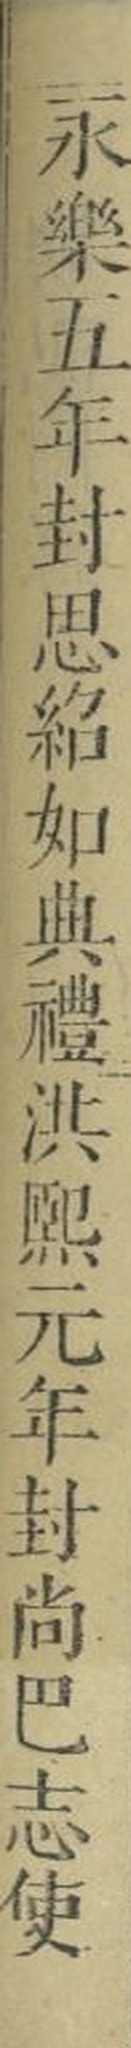永樂五年封思紹如典禮洪煕元年封尚巴志使
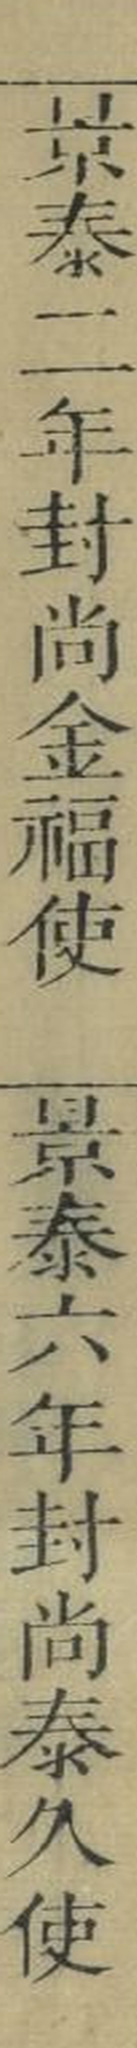景泰二年封尚金福使景泰六年封尚泰久使
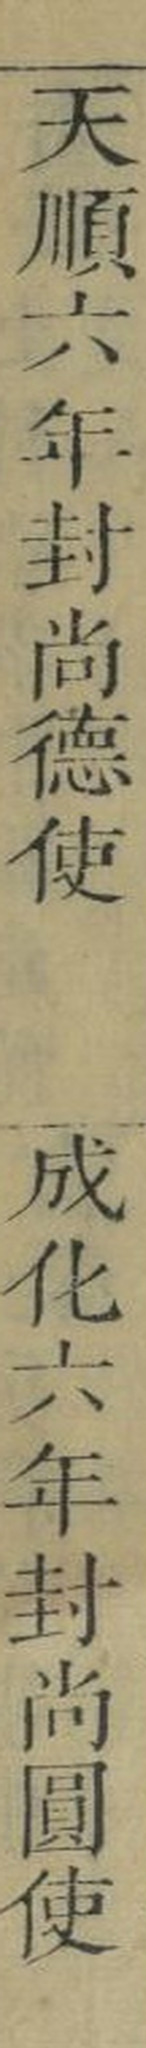天順六年封尚德使成化六年封尚圓使

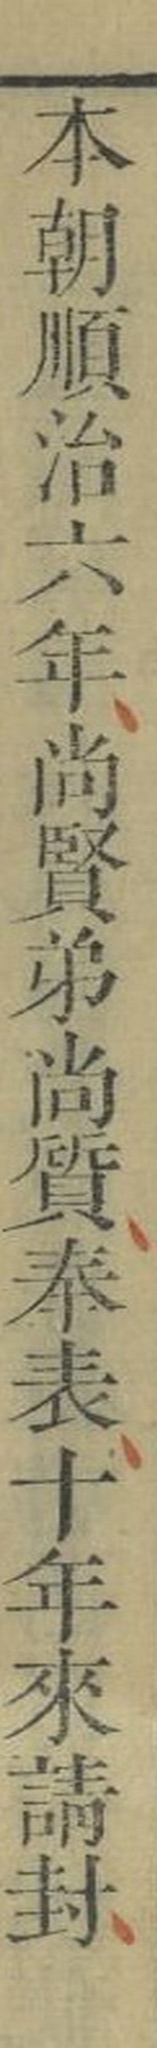本朝順治六年尚賢弟尚質奉表十年來請封
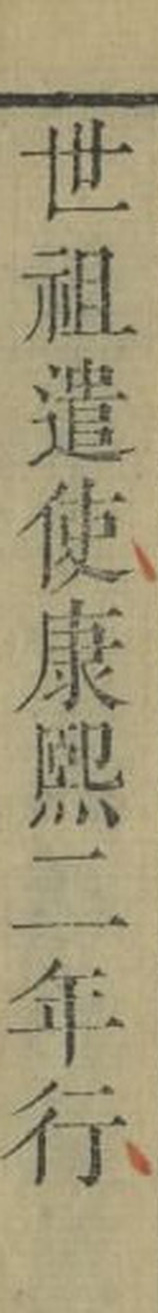世祖遣使康煕二年行

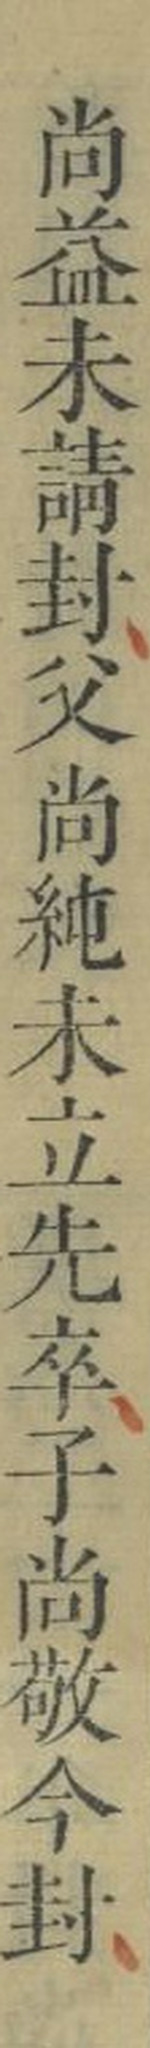尚益未請封父尚純未立先卒子尚敬今封
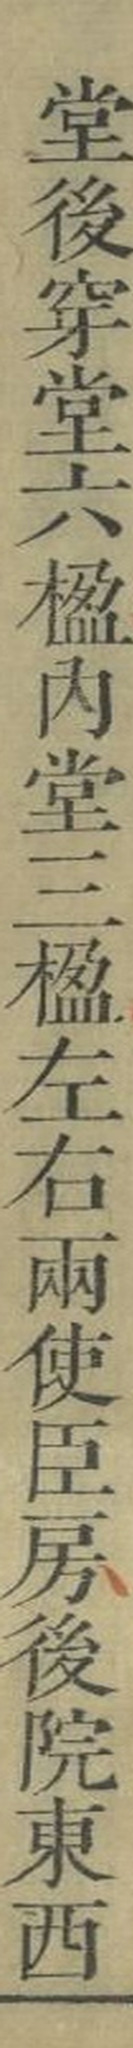堂後穿堂六楹内堂三楹左右兩使臣房後院東西
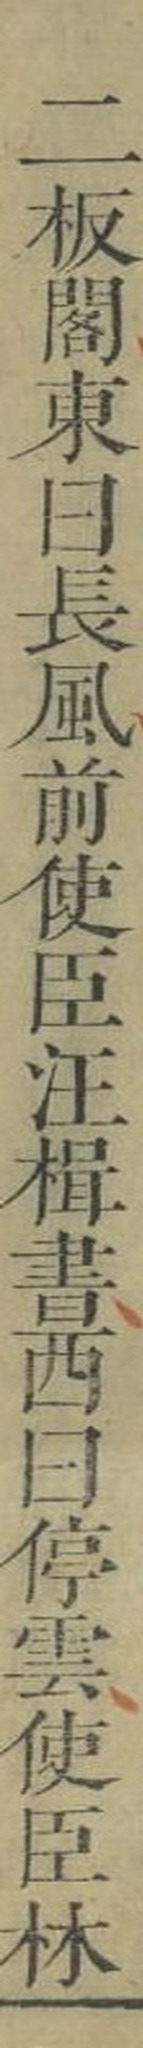二板閣東曰長風前使臣汪楫書西曰停雲使臣林
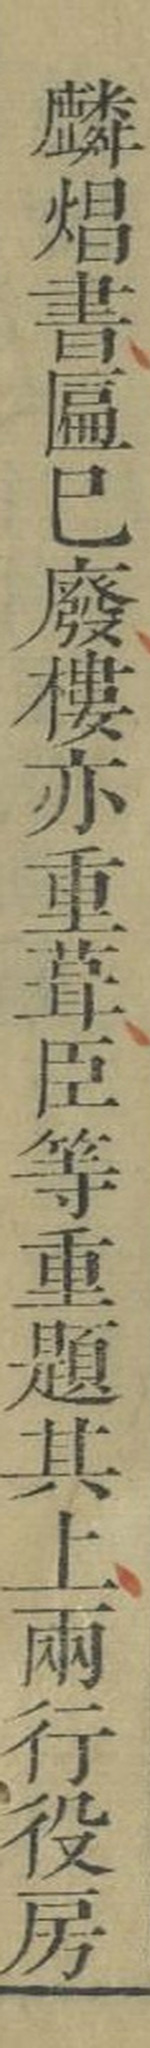麟焻書匾巳廢樓亦重葺臣等重題其上兩行役房
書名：中山伝信録 巻一、巻二
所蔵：University of the Ryukyus Library
